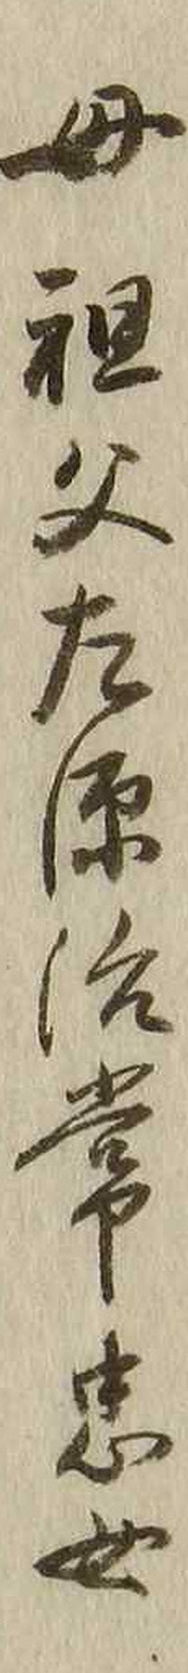母祖父左源治常忠女
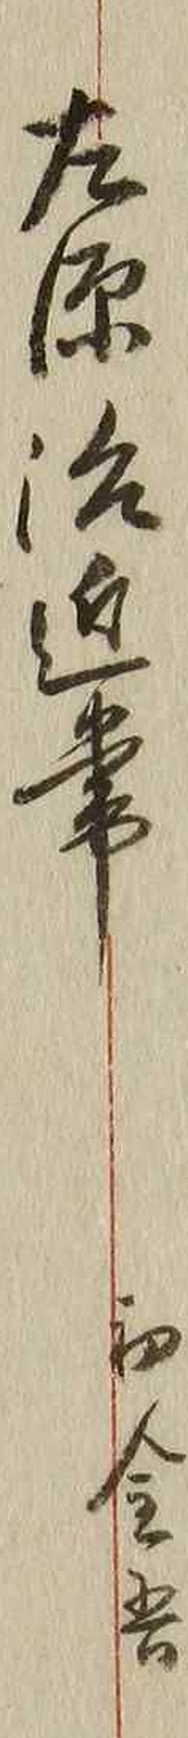左源治近常初金吾
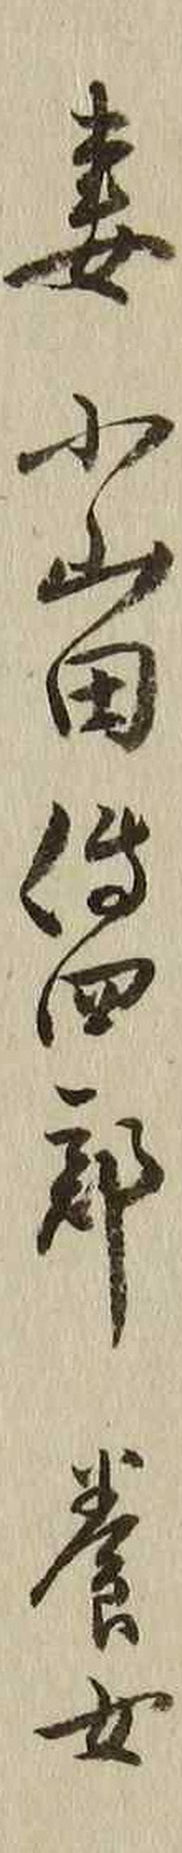妻小山田伝四郎養女
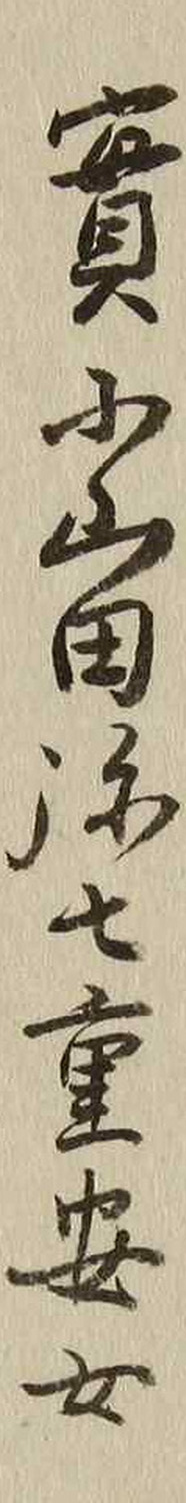実小山田弥七重安女
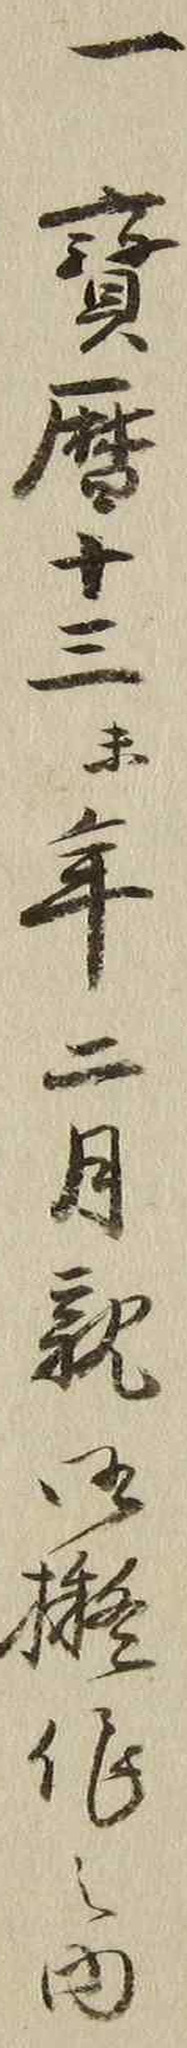一宝暦十三未年二月親御擬作之内
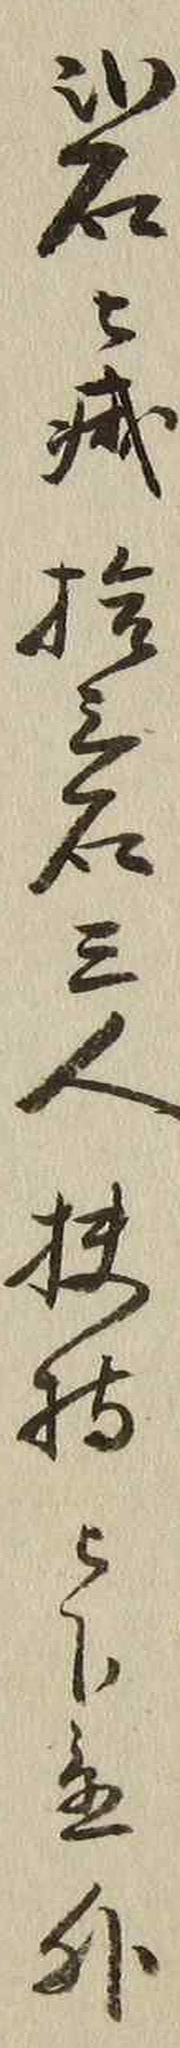弐石被減拾三石三人扶持被下置外
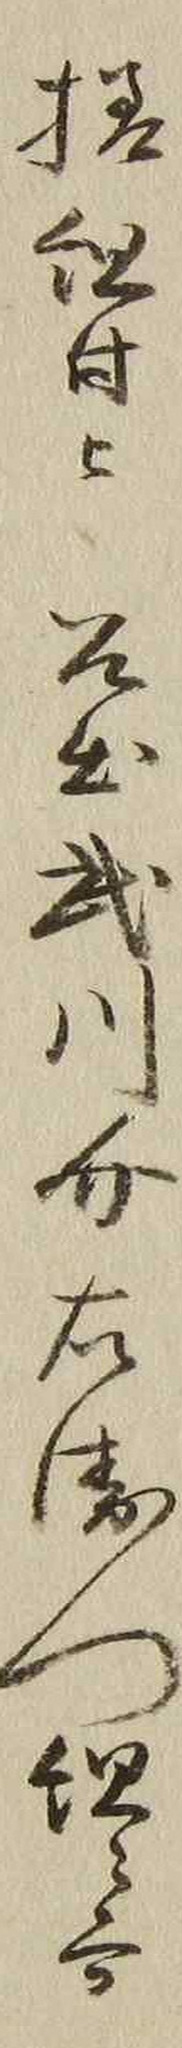様組付被召出武川介右衛門組ニ而
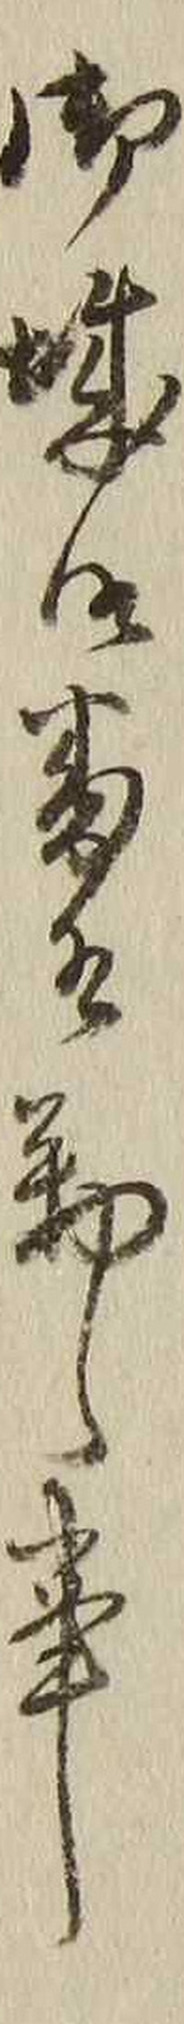御城御番相勤候事
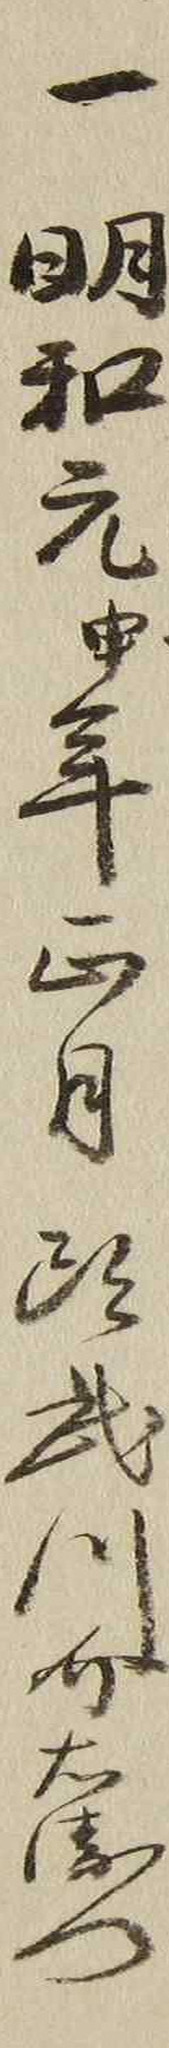一明和元申年正月頭武川介右衛門
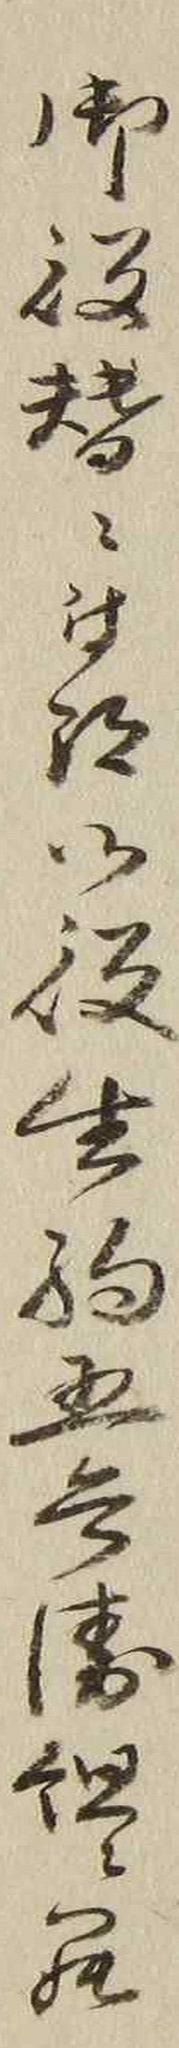御役替ニ付跡御役生駒五兵衛組ニ罷
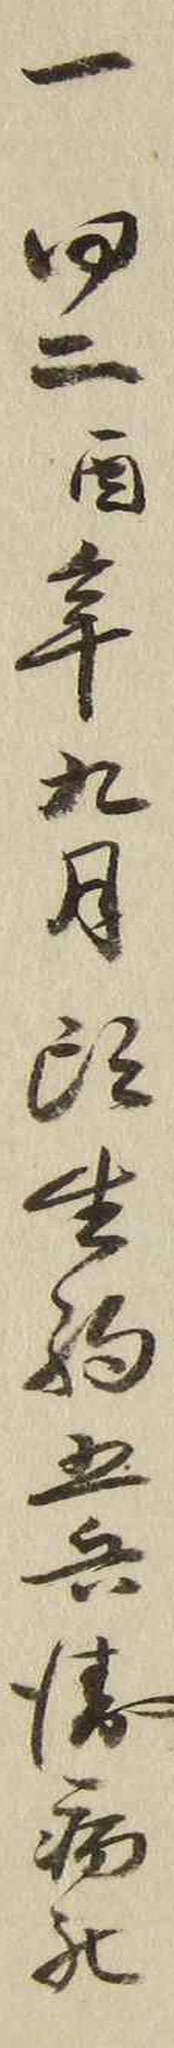一同二酉年九月頭生駒五兵衛病死

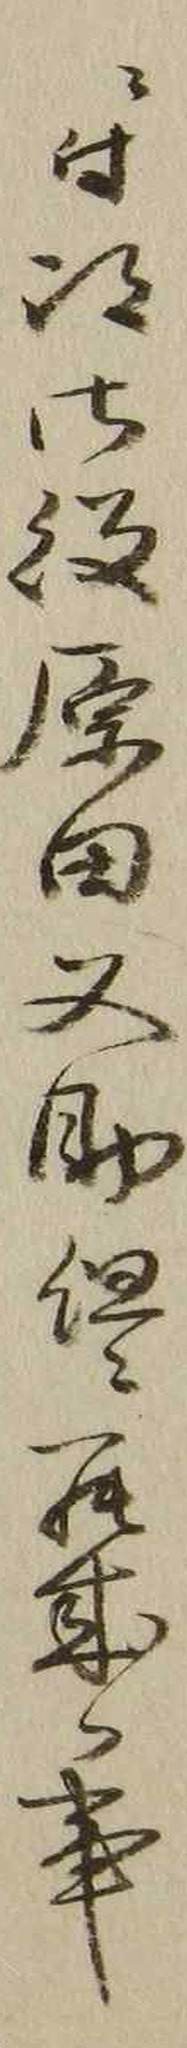ニ付跡御役原田又助組ニ罷成候事
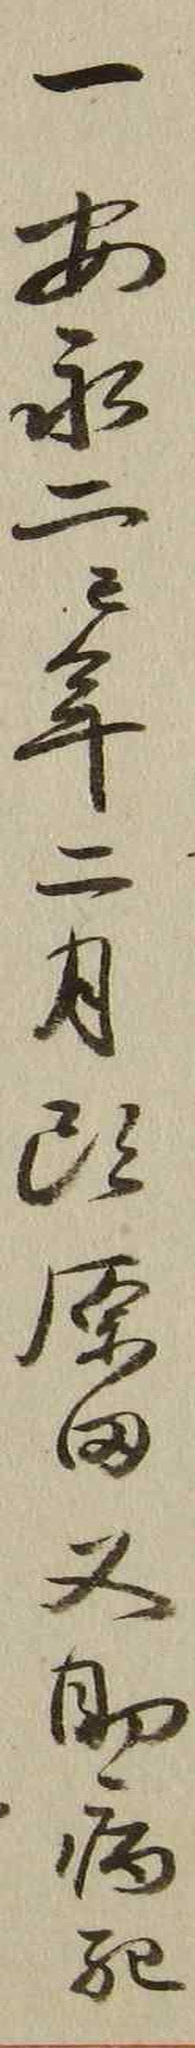一安永二巳年二月頭原田又助病死
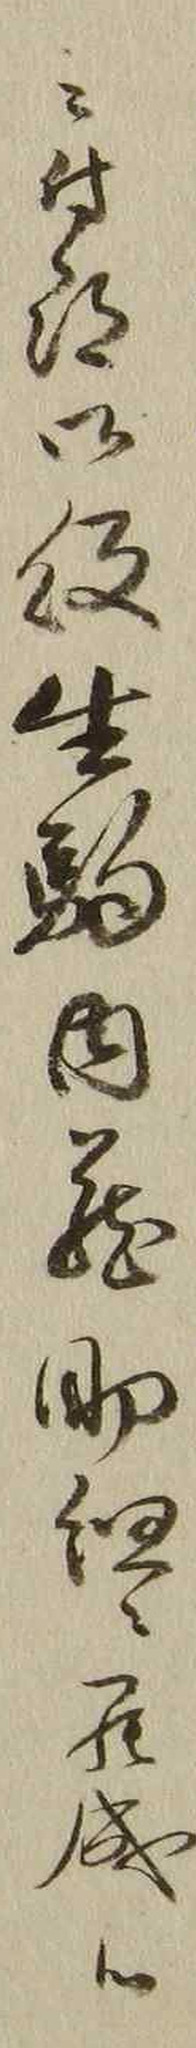ニ付跡御役生駒内蔵助組ニ罷成候
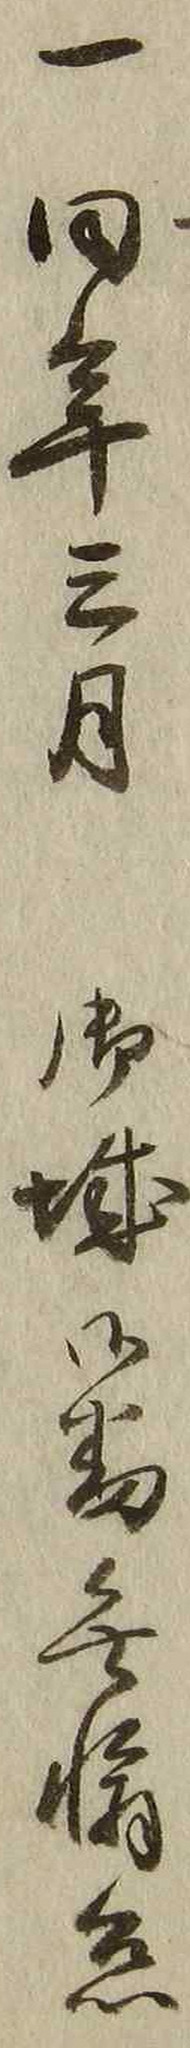一同年三月御城御番無懈怠
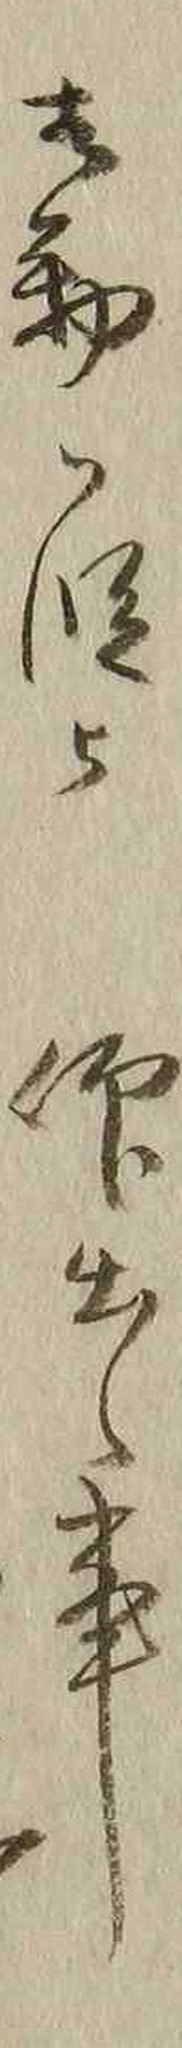相勤候段被仰出候事
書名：諸士系譜　巻之236　ふ之部4
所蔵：会津若松市立会津図書館
